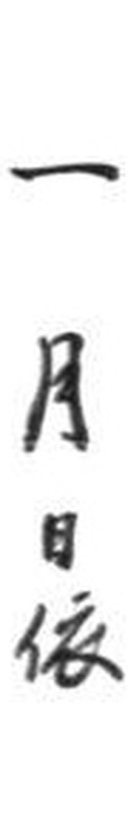一月日依
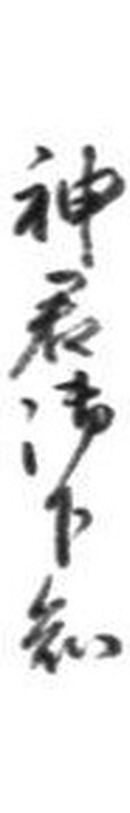神君御下知
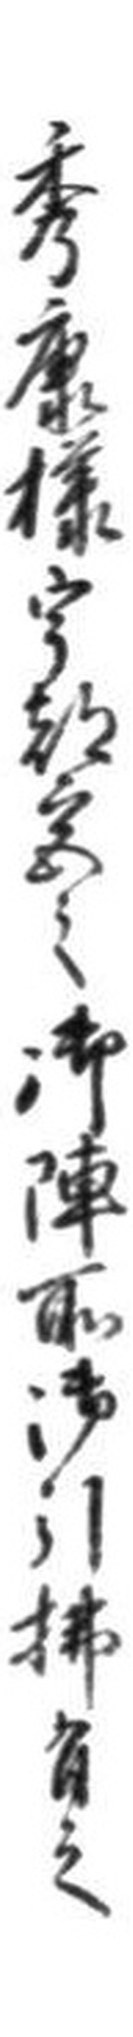秀康様宇都宮之御陣所御引払有之
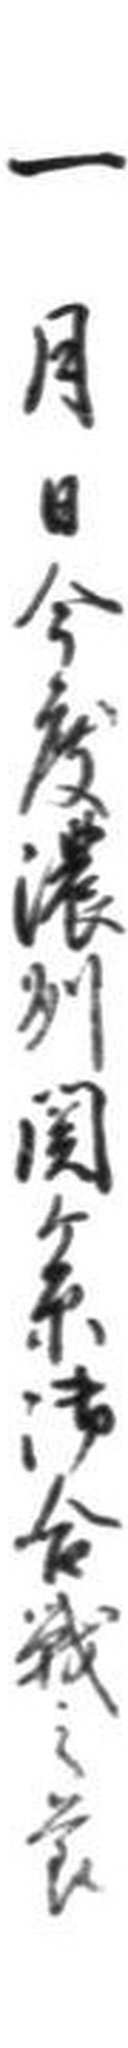一月日今度濃州関ヶ原御合戦之節
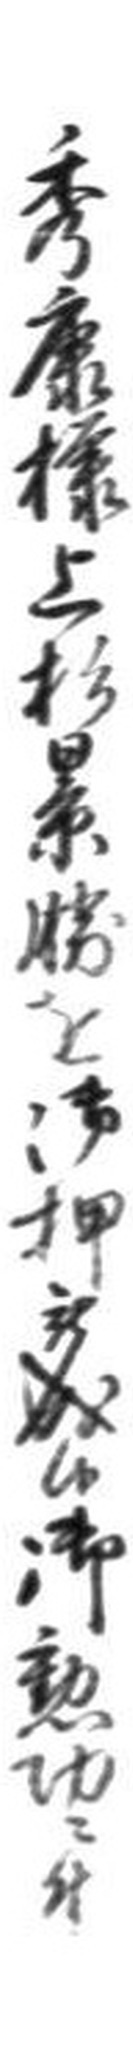秀康様上杉景勝を御押被成候御勲功ニ付
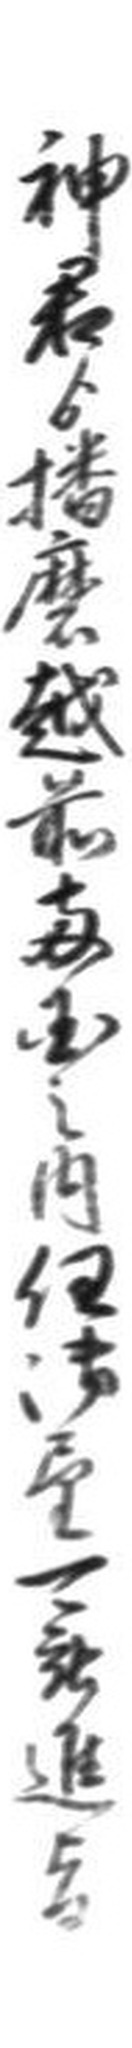神君ゟ播磨越前両国之内任御望可被進旨
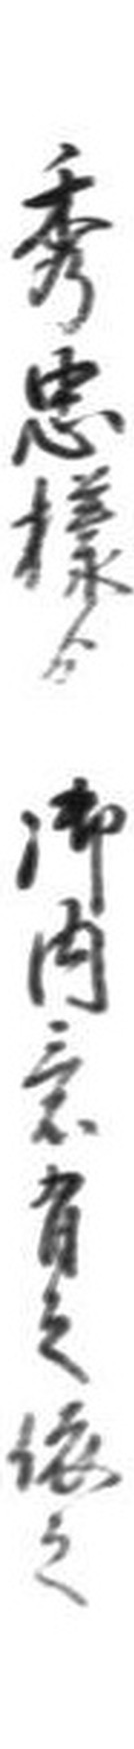秀忠様ゟ御内意有之依之
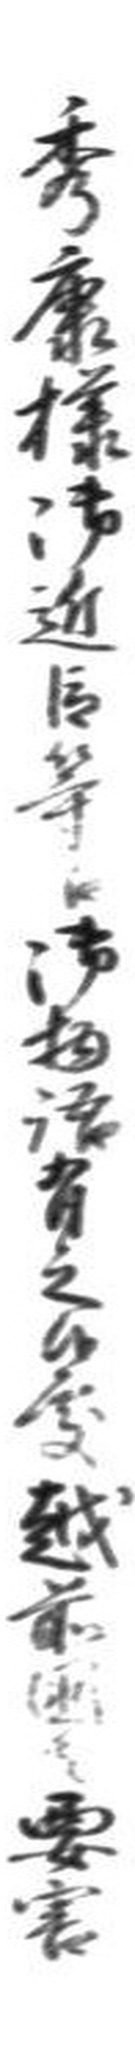秀康様御近臣等江御物語有之候処越前国者要害
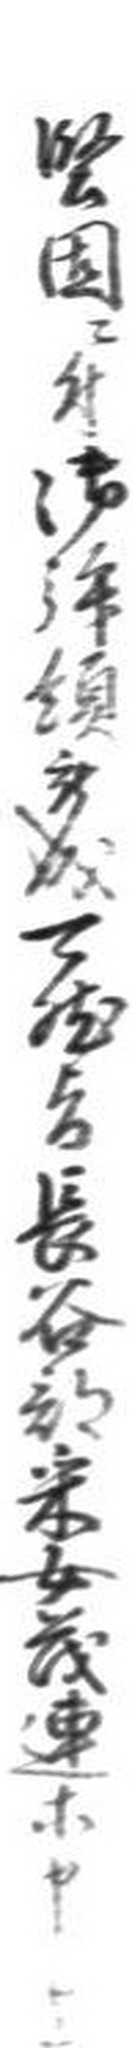堅固ニ付御拝領被成可然旨長谷部采女茂連等申上
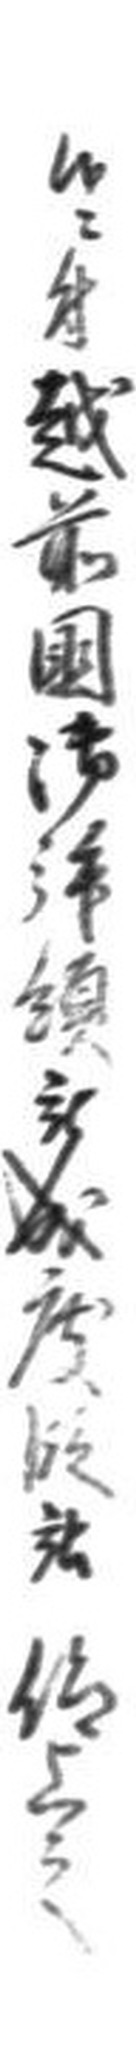候ニ付越前国御拝領被成度段被仰上之

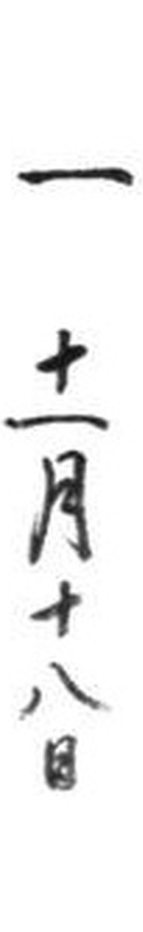一十一月十八日
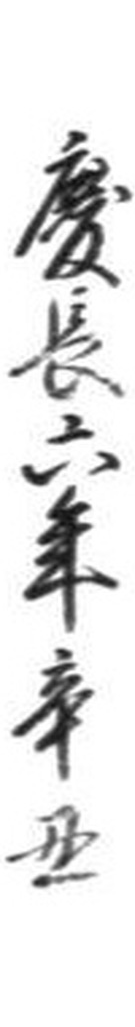慶長六年辛丑
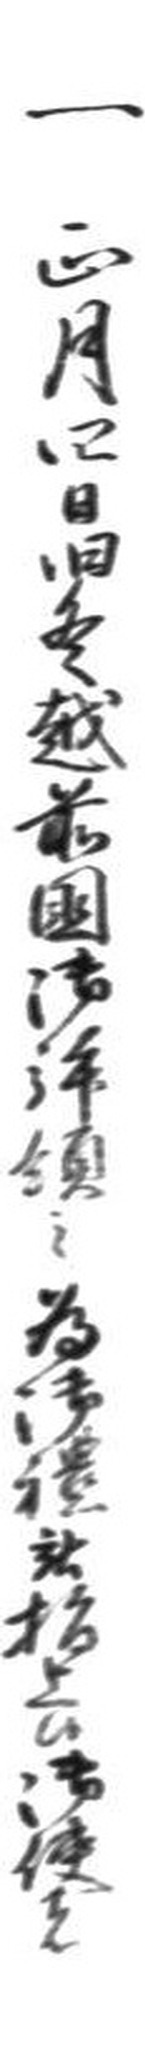一正月四日旧冬越前国御拝領之為御礼被指上候御使者
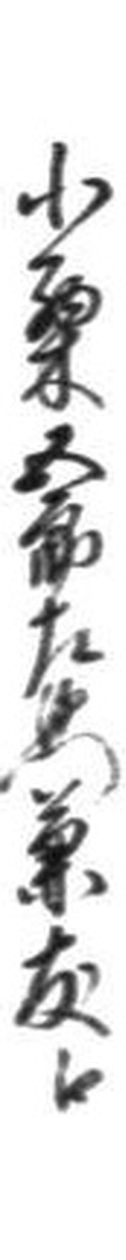小栗五郎左衛門兼友江
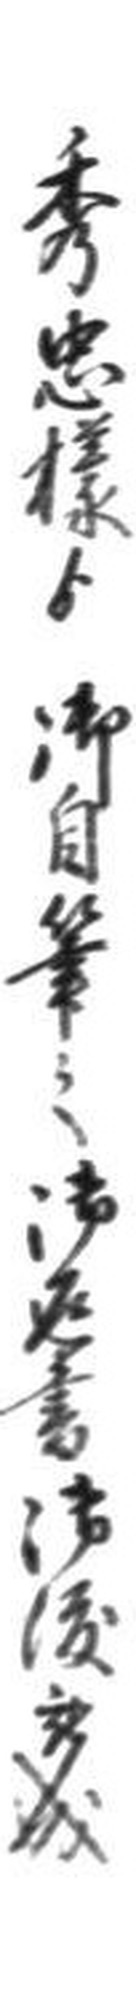秀忠様ゟ御自筆之御返書御渡被成
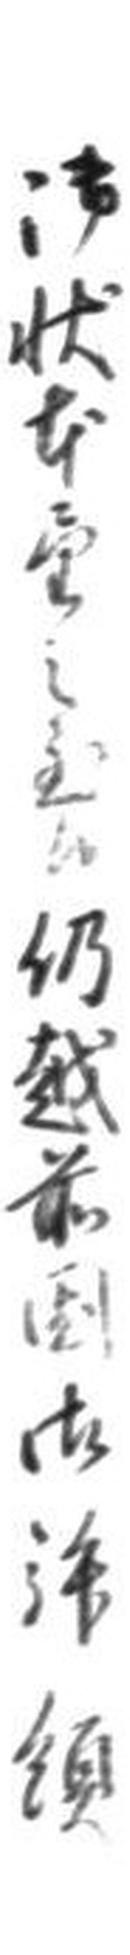御状本望之至候仍越前国御拝領
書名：家譜 一 秀康公 従天正二年到慶長十二年
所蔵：福井県文書館 Fukui Prefectural Archives
